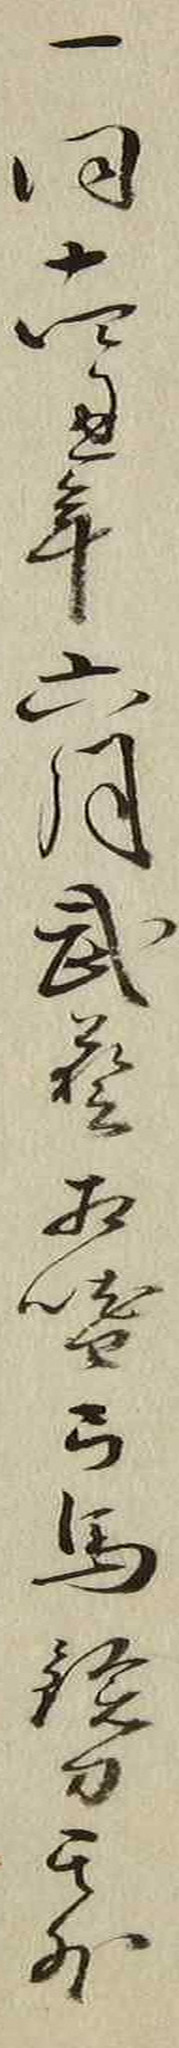一同十四丑年六月武芸相稽弓馬銃刀其外
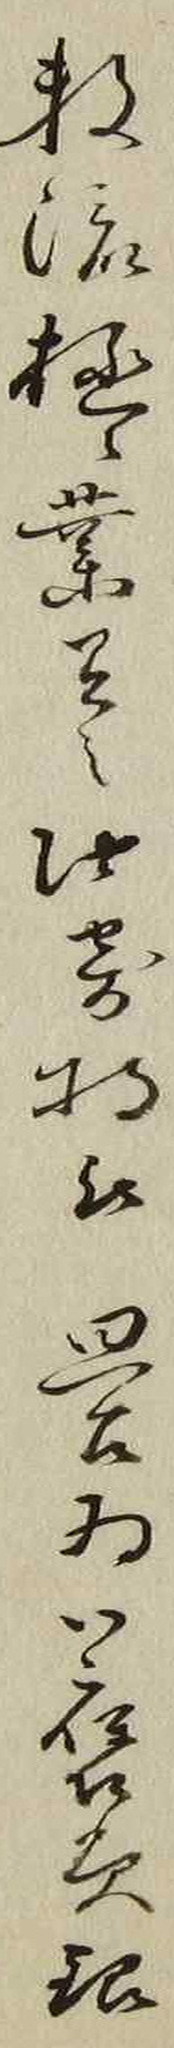数流極之業之寄物被思召為御褒美銀
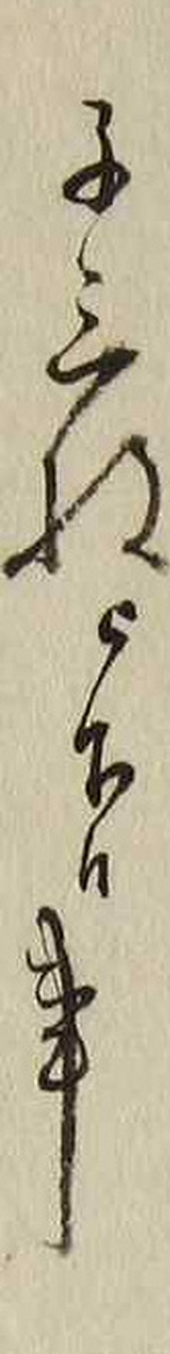子三枚被下候事
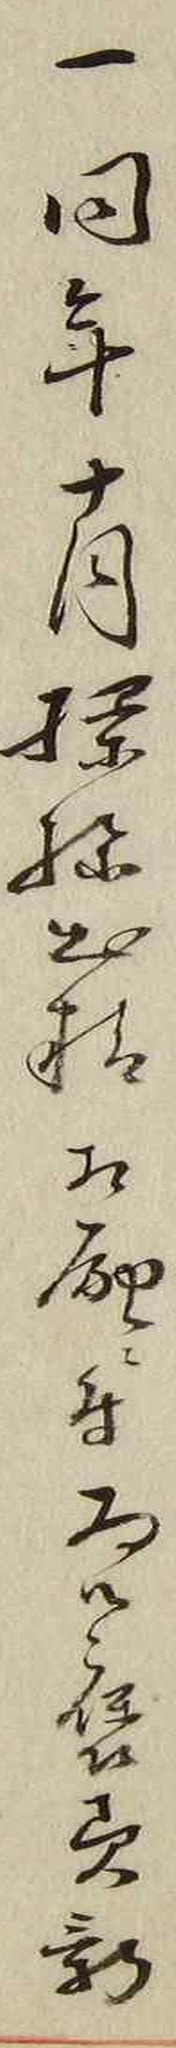一同年十月操練出精相励に付為御褒美新
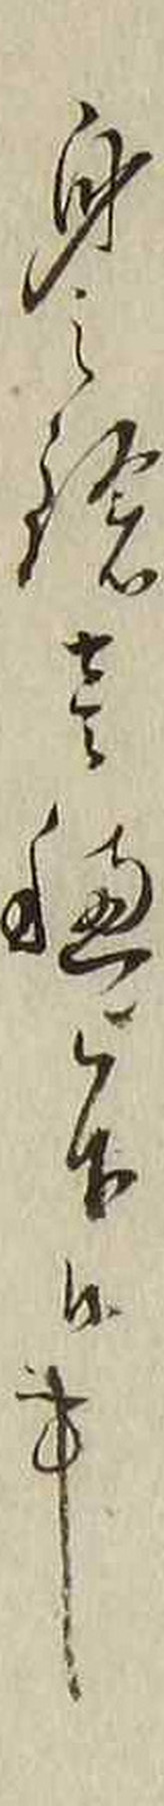身之鎗壱穂被下候事

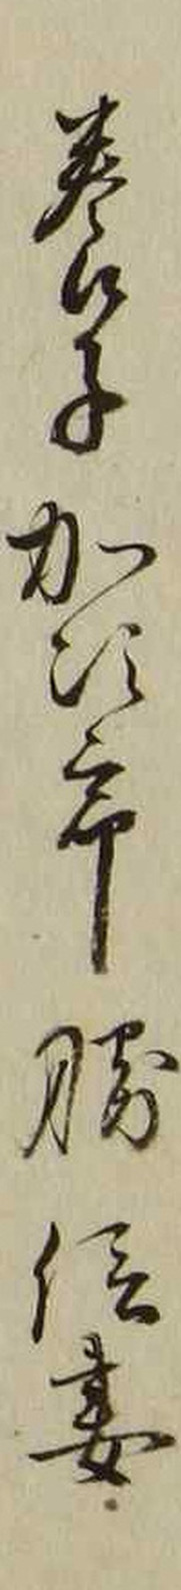女養子加次郎勝伝妻
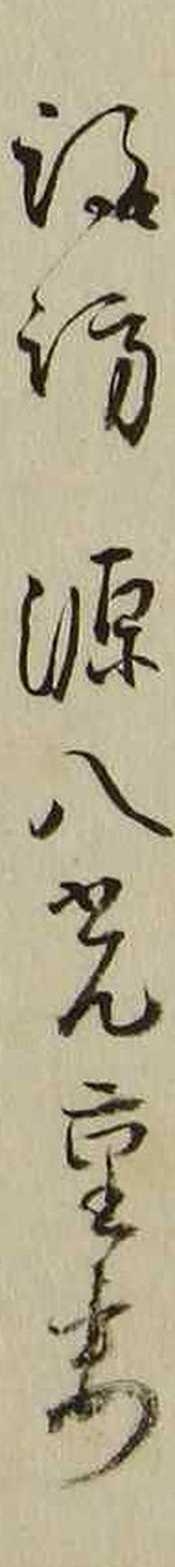女諏訪源八光重妻
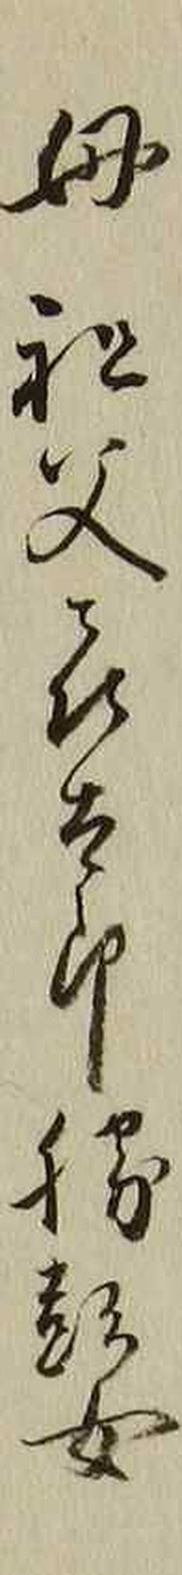母祖父喜太郎勝彭女
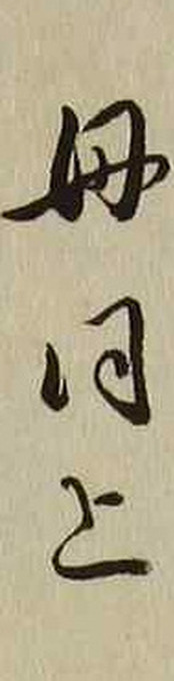母同上
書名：諸士系譜　巻之6　い之部6
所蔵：会津若松市立会津図書館
